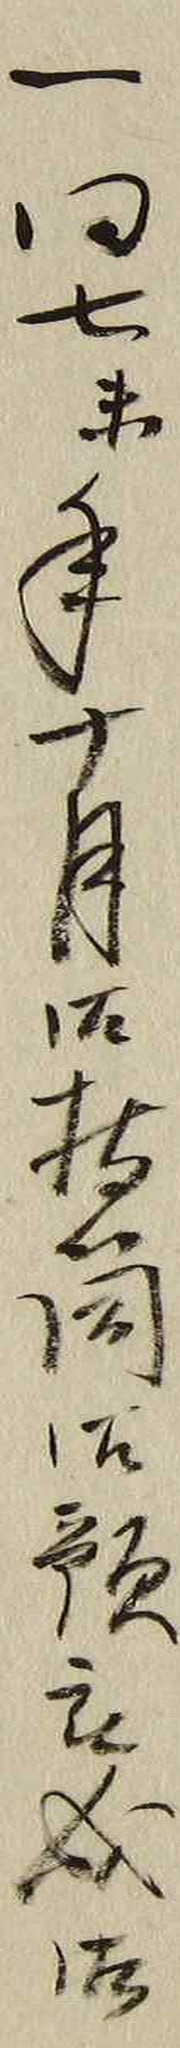一同七未年十月御持筒御預被成御
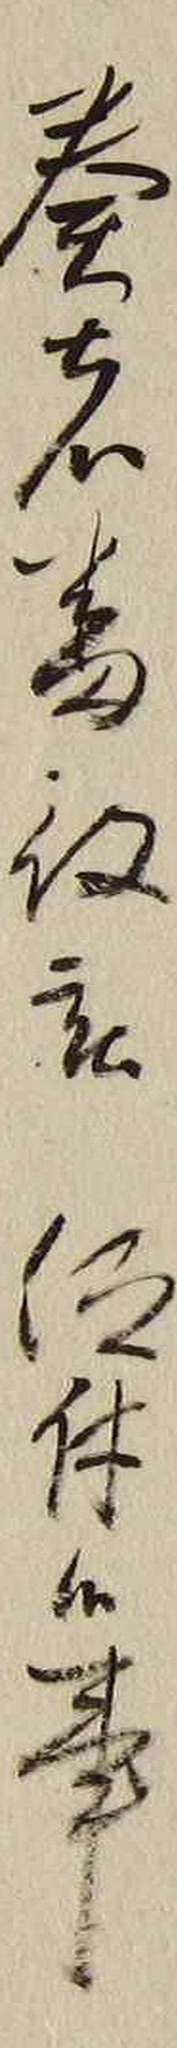奏者番役被仰付候事
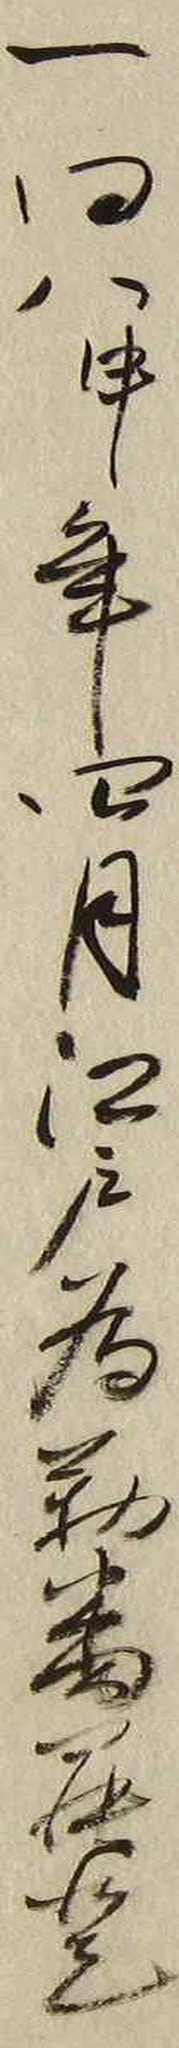一同八申年四月江戸為勤番罷登

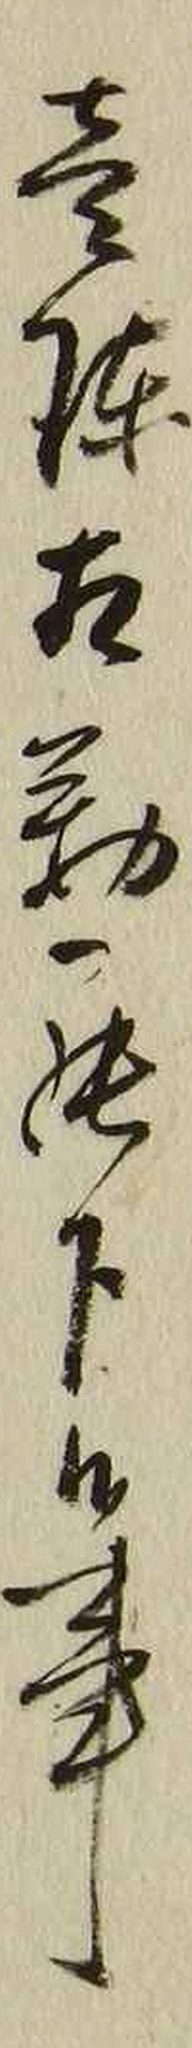壱陣相勤罷下候事
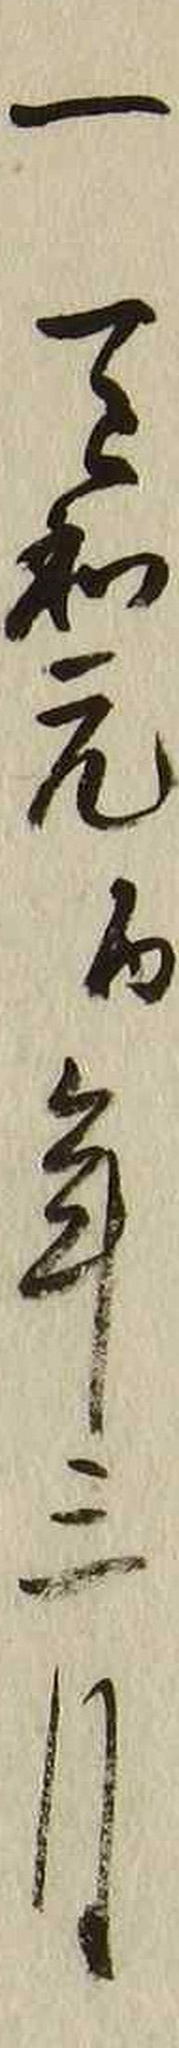一天和元酉年三月
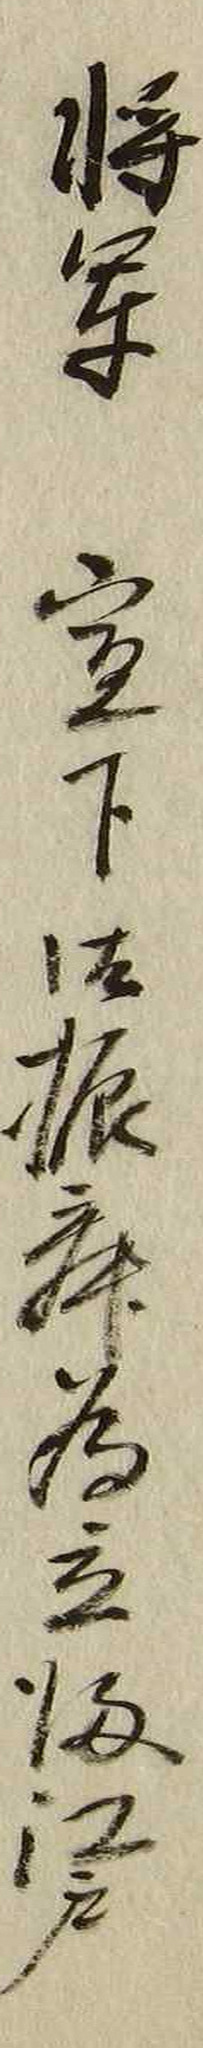将軍宣下御振舞為立帰江戸
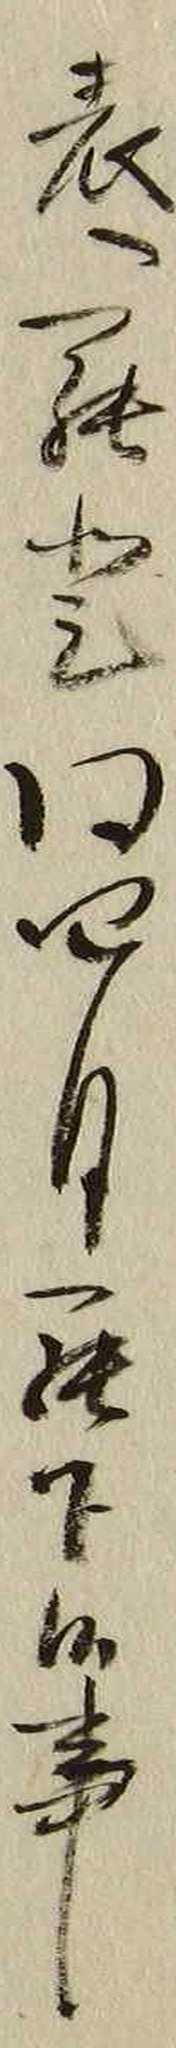表へ罷登同四月罷下候事
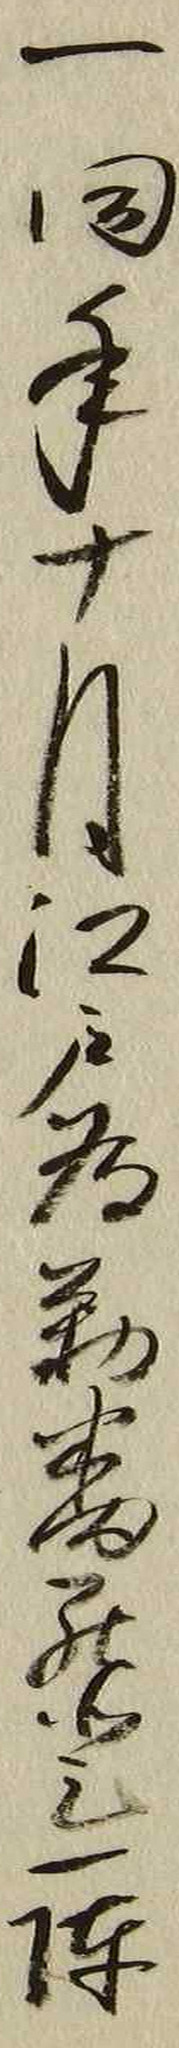一同年十月江戸為勤番罷登一陣
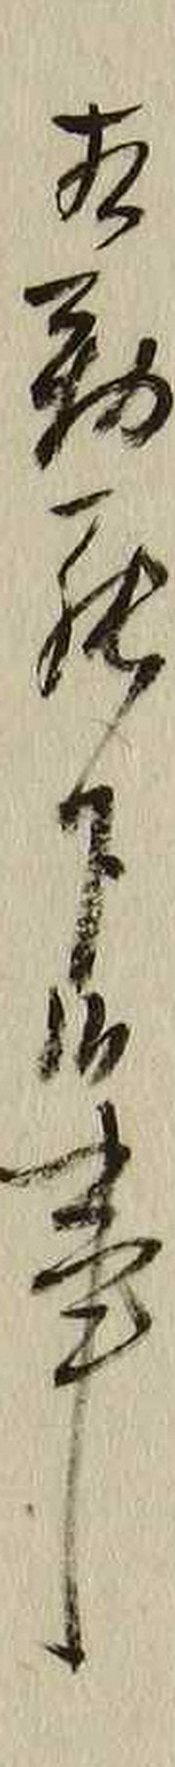相勤罷下候事
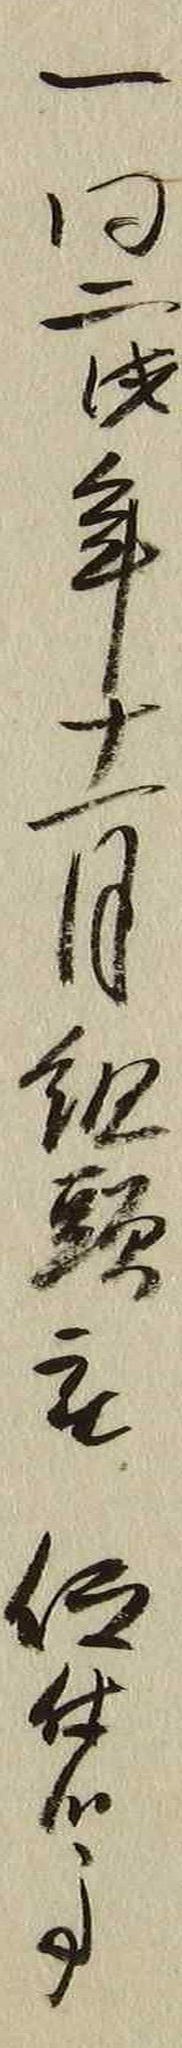一同二戌年十一月組頭被仰付候事
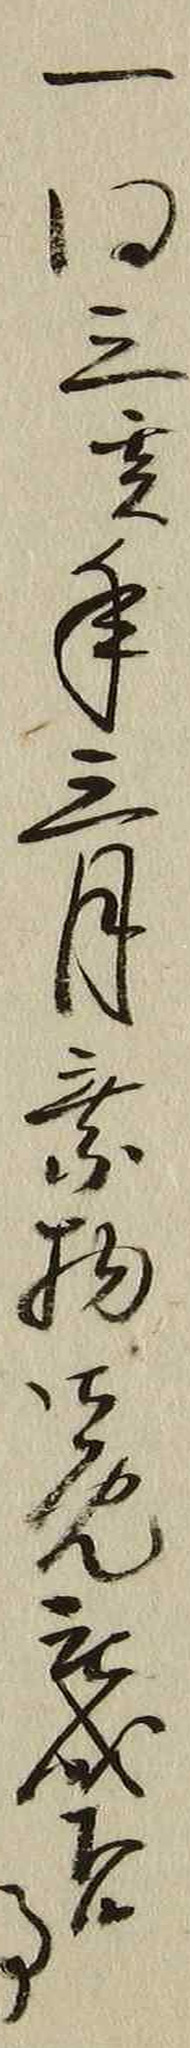一同三亥年三月乗物御免被成下候事
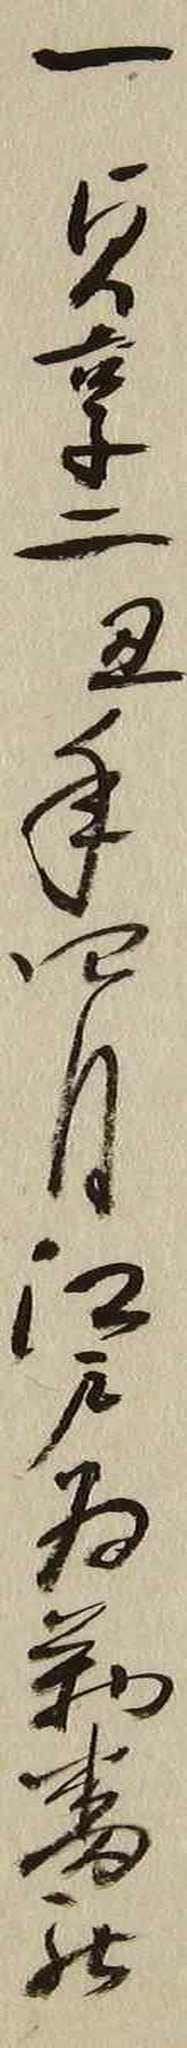一貞享二丑年四月江戸為勤番罷
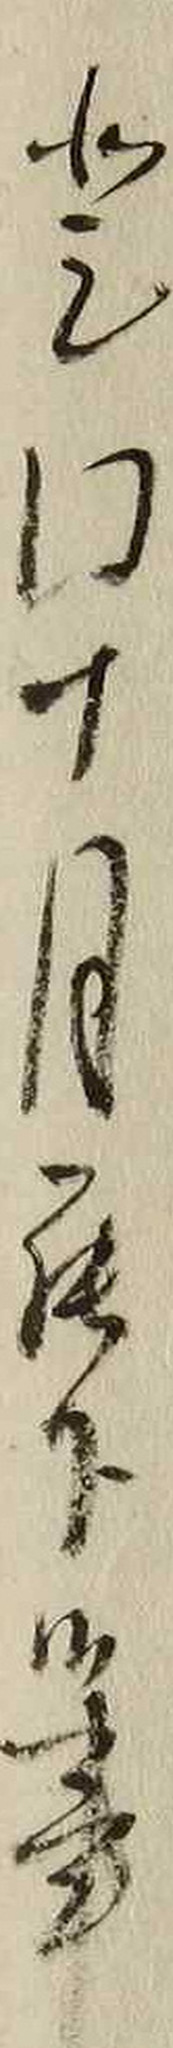登同十月罷下候事
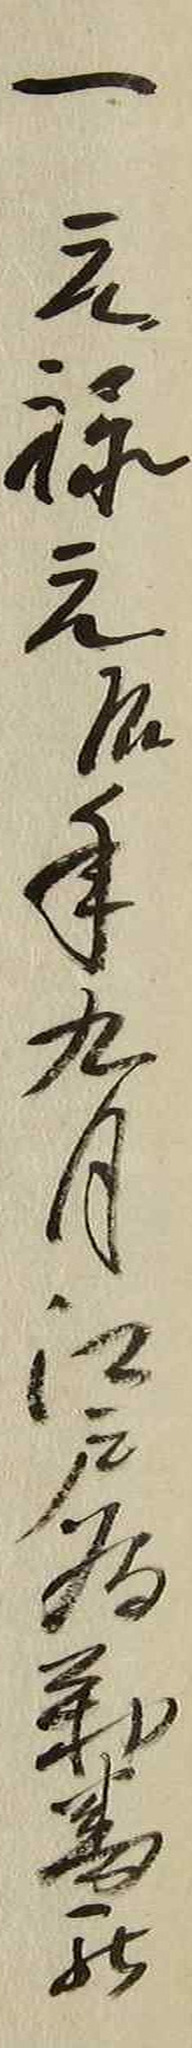一元禄元辰年九月江戸為勤番罷
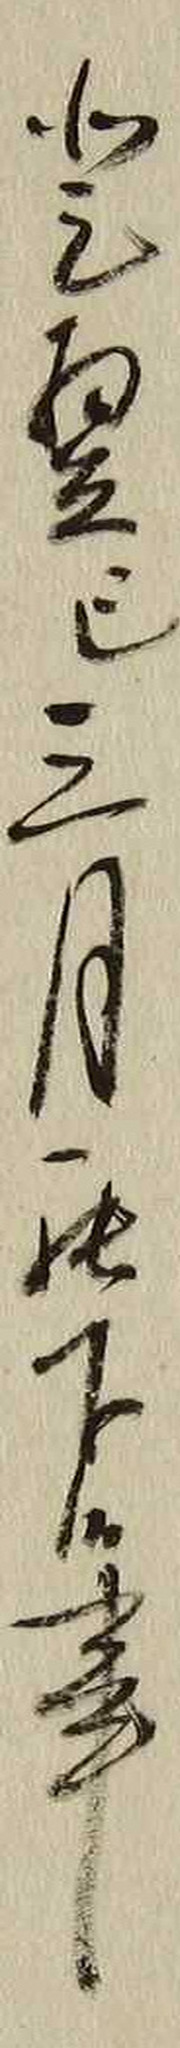登翌巳三月罷下候事
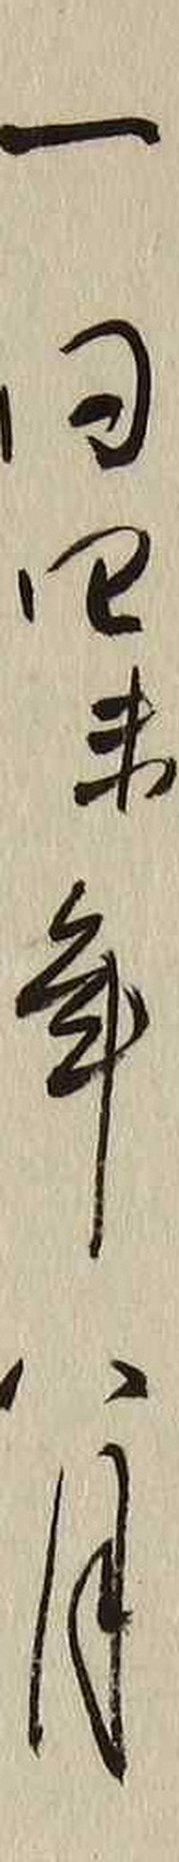一同四未年八月
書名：諸士系譜　巻之351　す之部1
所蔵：会津若松市立会津図書館
